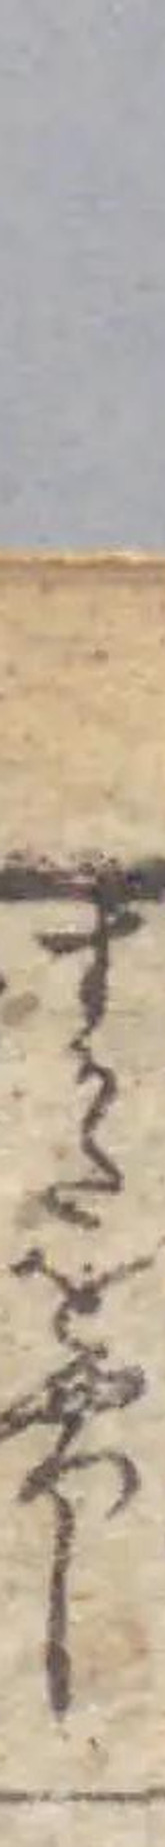すかたをやつし
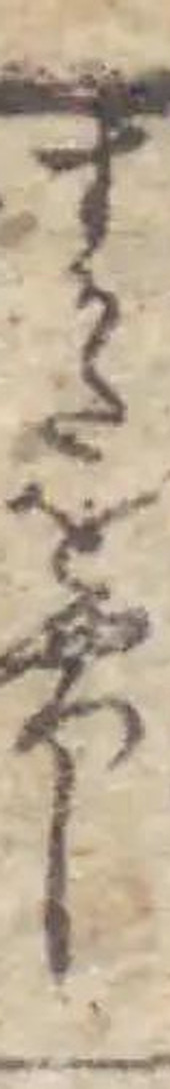すかたをやつし
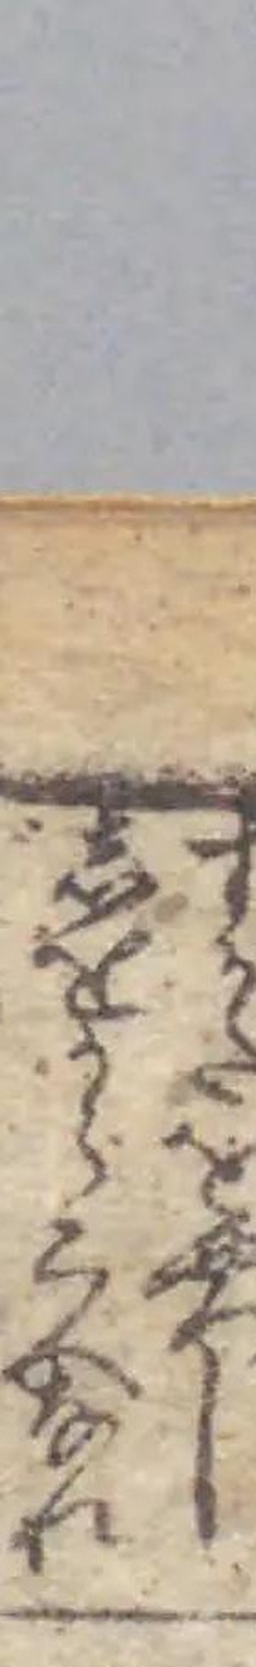しをからこへなれ
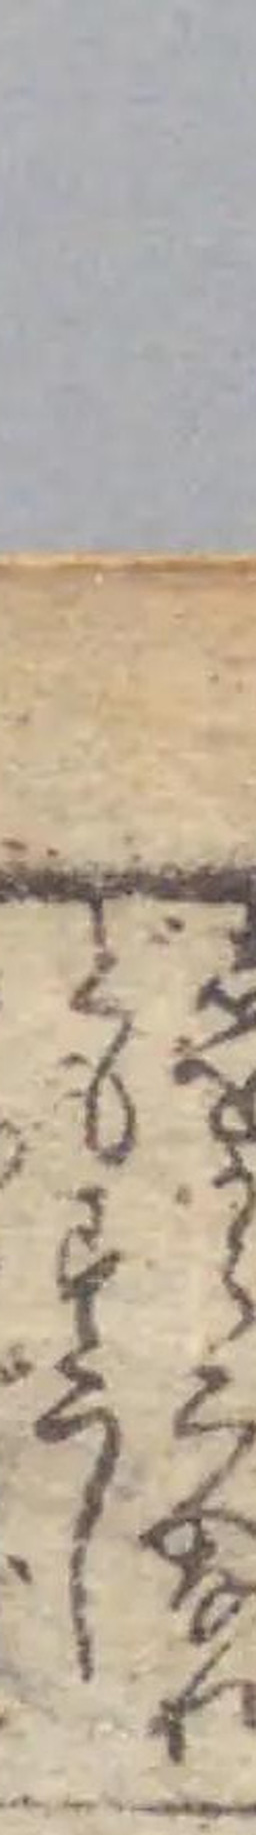どもすこし
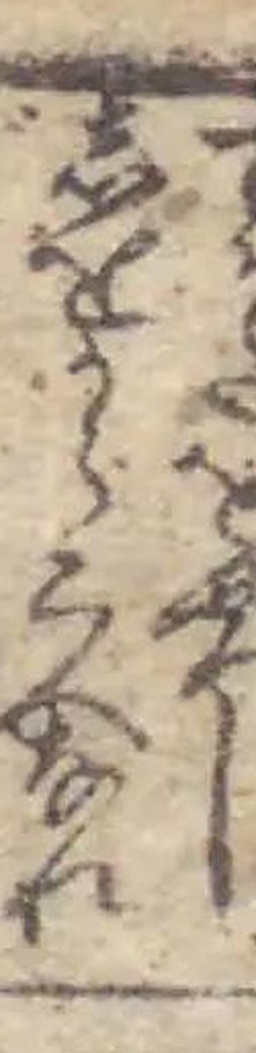しをからこへなれ
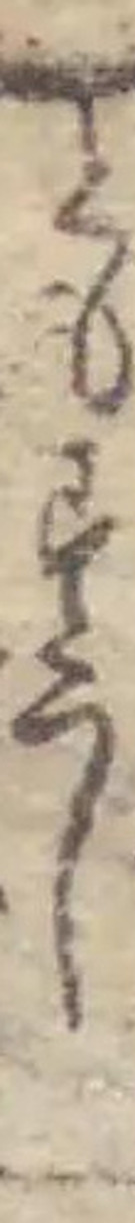どもすこし
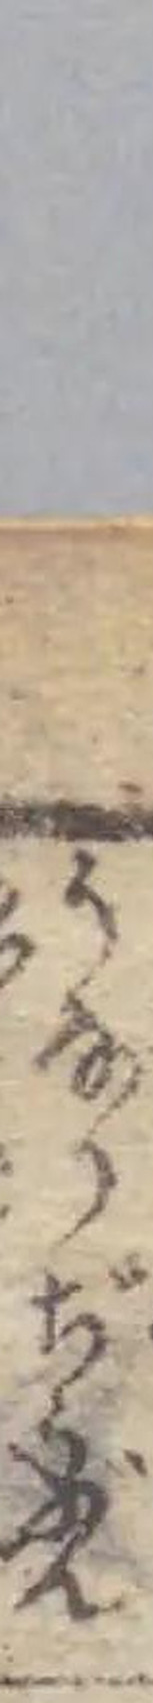うなりぢうぶん
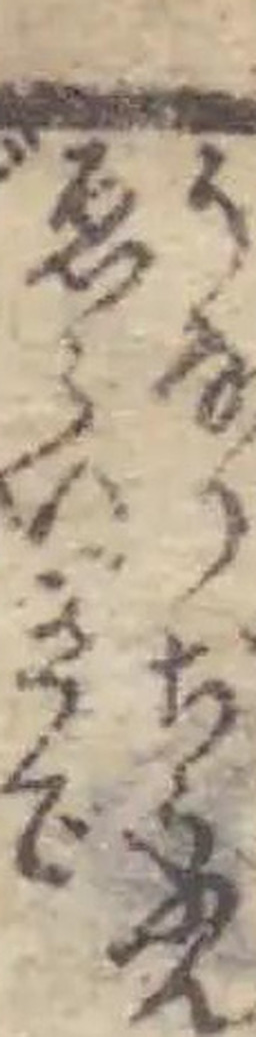ゑらいきで
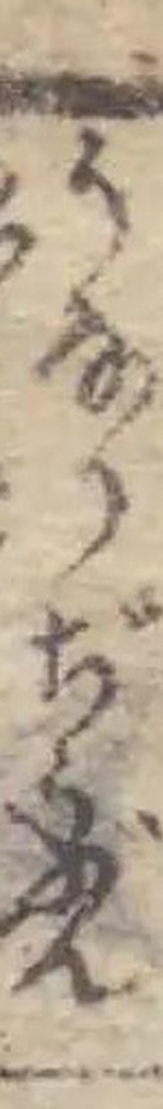うなりぢうぶん
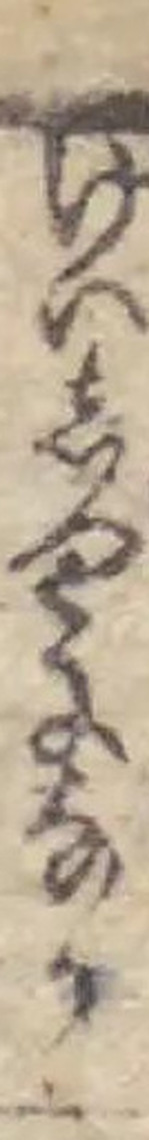げいしやになり
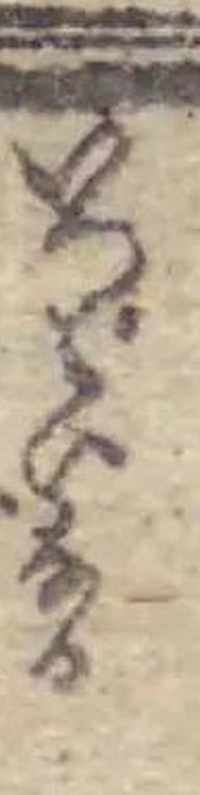いつはいなる
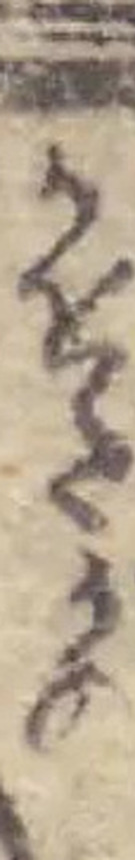かをたがの
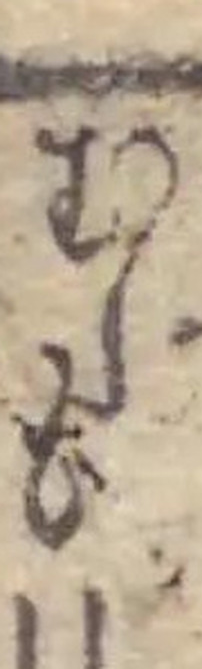むしも
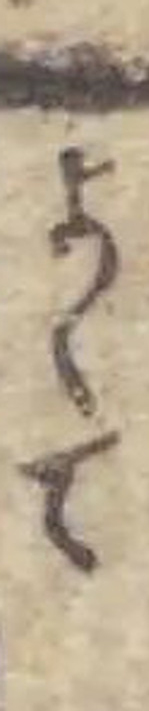よくて
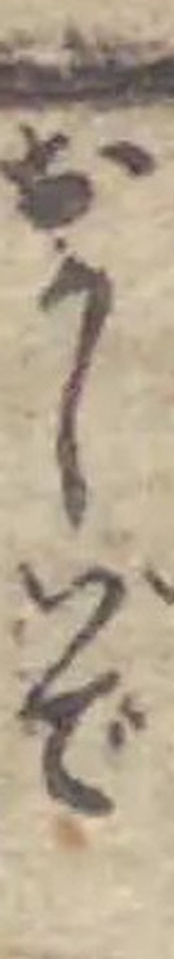おかしいで
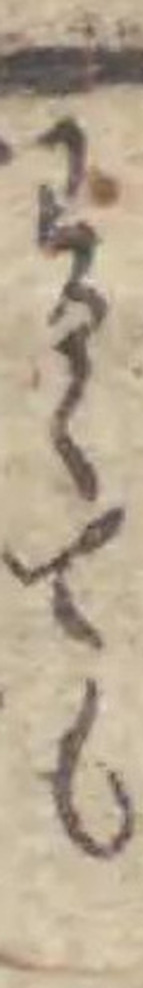わるくても
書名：蟹牛房挟多 3巻
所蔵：国立国会図書館 National Diet Library, JAPAN
